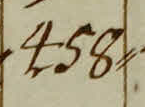458
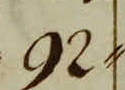92
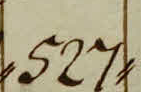527
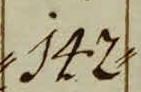142
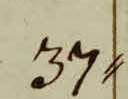37
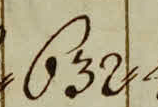632
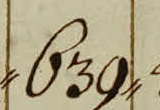639
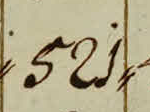521
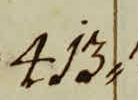413
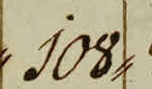108
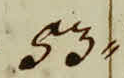53
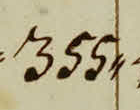355
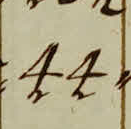44
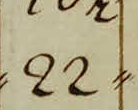22
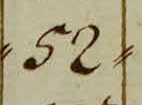52
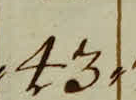43
